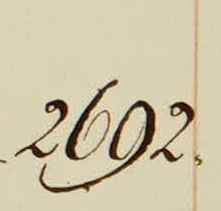2692
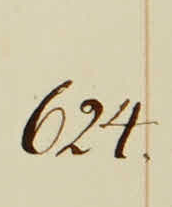624
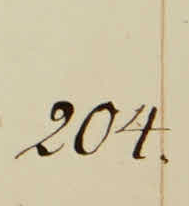204
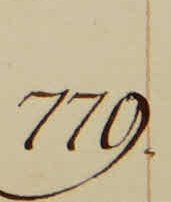779
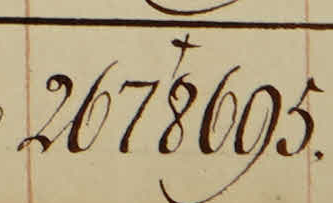2678695
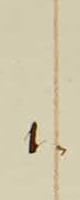1
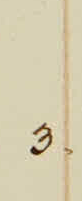3
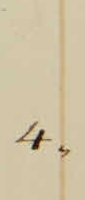4
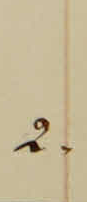2
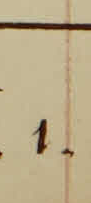1
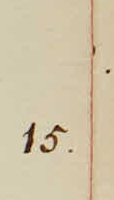15.
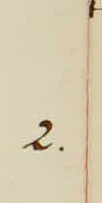2.
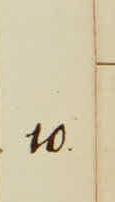10.
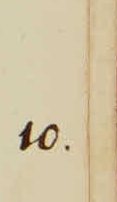10.
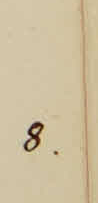8.
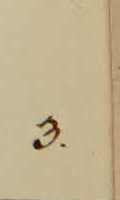3.
